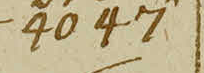4047
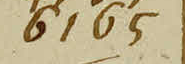6165
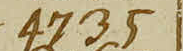4735
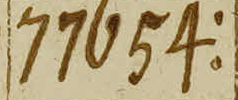77654
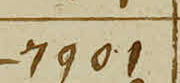7901
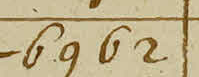6962
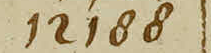12188
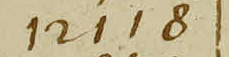12118
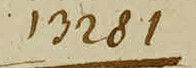13281
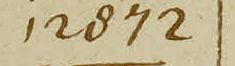12872
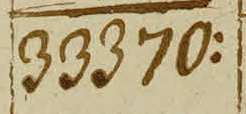33370
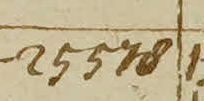25578
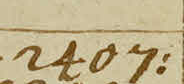2407
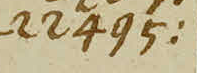22495
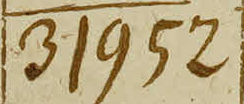31952
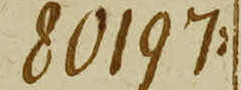80197
